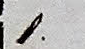1.
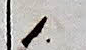1.
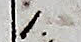1.
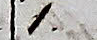1.
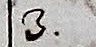3.
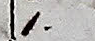1.
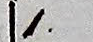1.
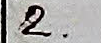2.
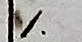1.
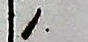1.
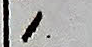1.
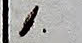1.
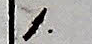1.
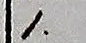1.
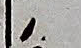1.
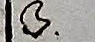3.
